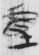童
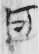耳
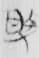受
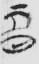○（期）
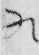九
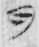月
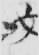戊
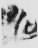申
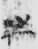之
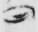日
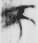不
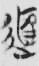𬨭（將）
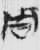周
